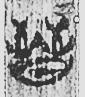晉
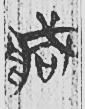戕
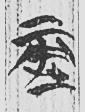坪
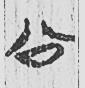公
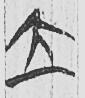立
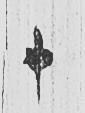十
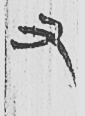又
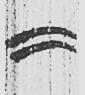二
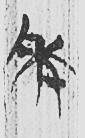年
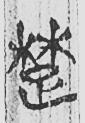楚
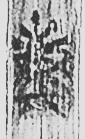康
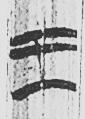王
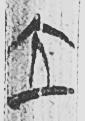立
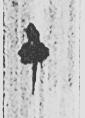十
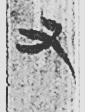又
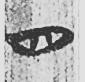四
